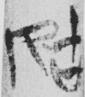姑（苦）
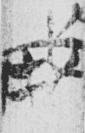○（成）
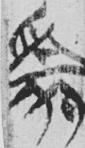○（家）
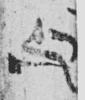父
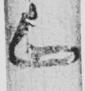㠯（以）
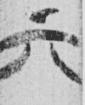亓（其）
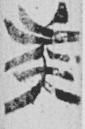族
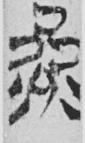參（三）
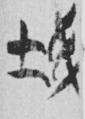○（郤）
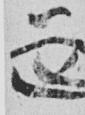正（征）
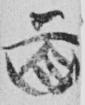百
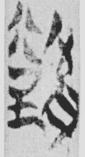○（豫）
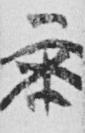不
